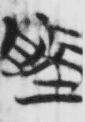陵
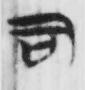司
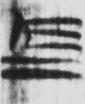馬
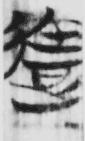達
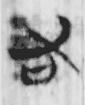右
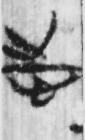志
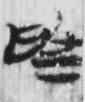爲
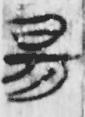昜
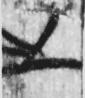之
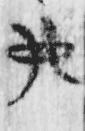四
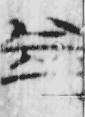益
